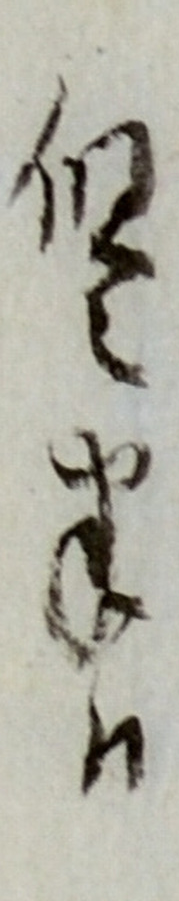但し半日
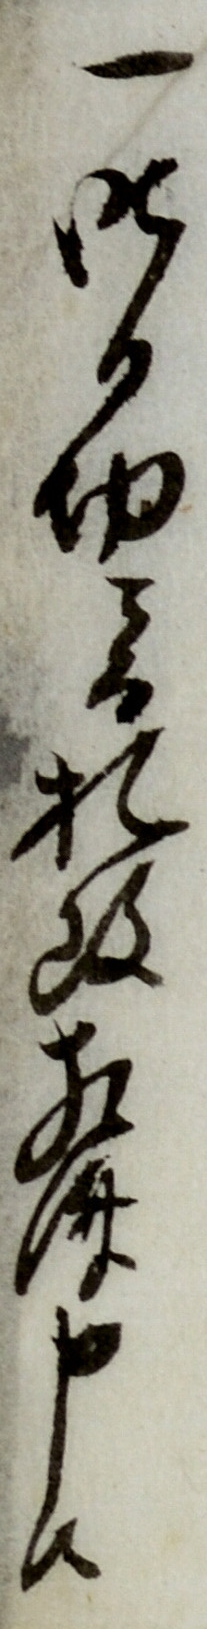一昨日切にて札改相済申候

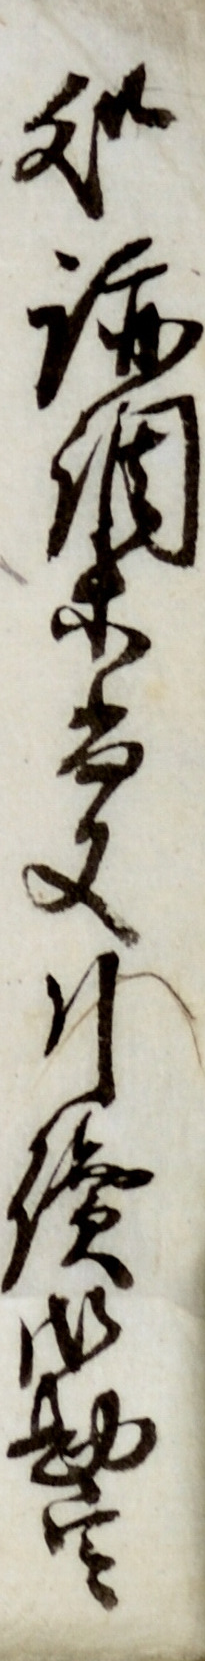処跡調等尚又引続御勘定
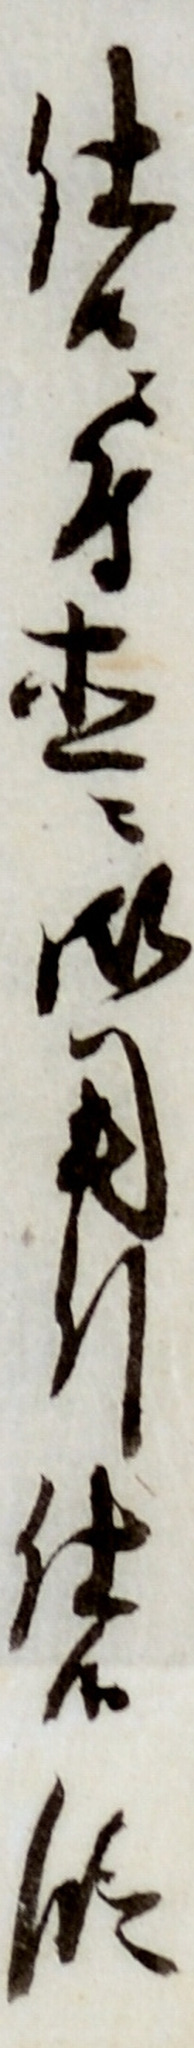仕候に付直に御用引仕候段
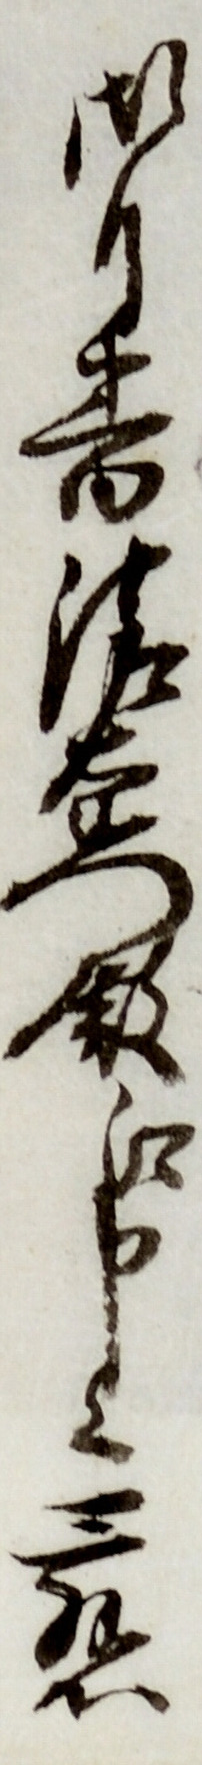御月番清右衛門殿え申上可然
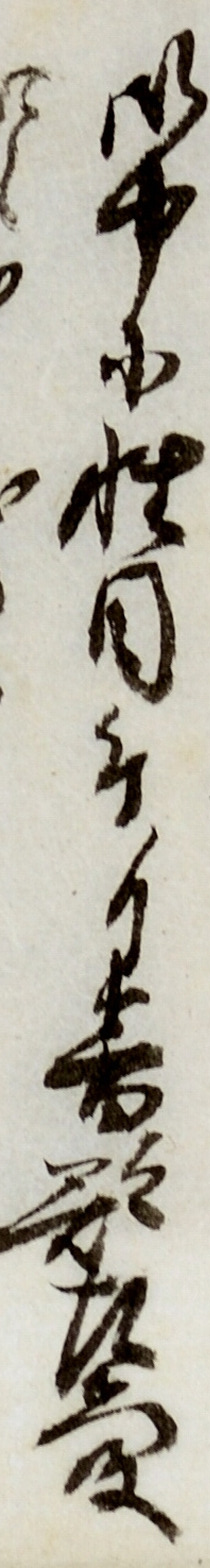御中小性目付月番郡左衛門殿
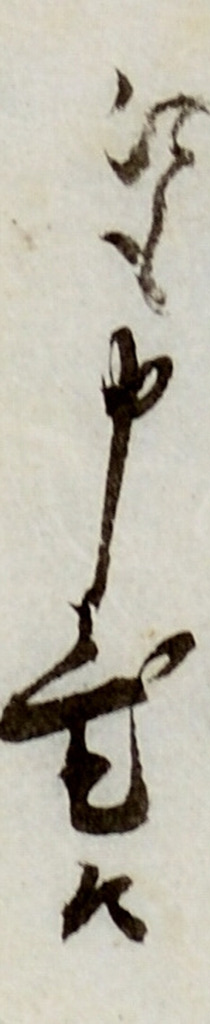えも申置候
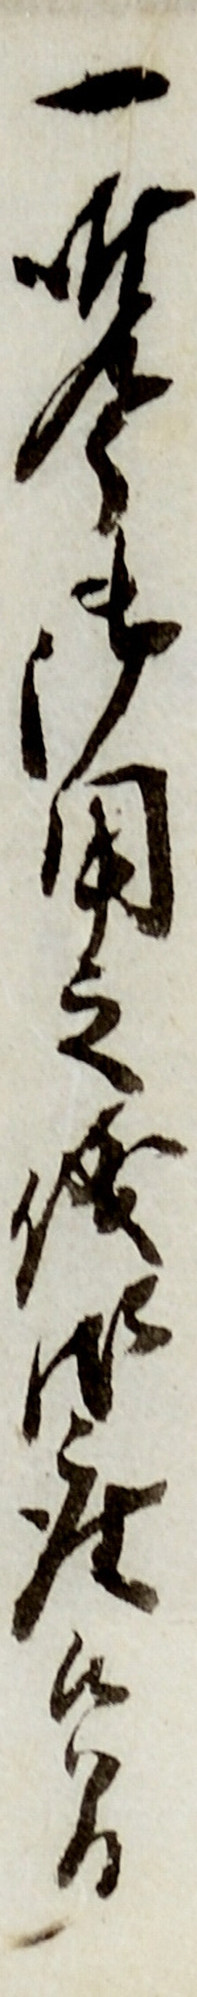一昨今御用之儀御座候間
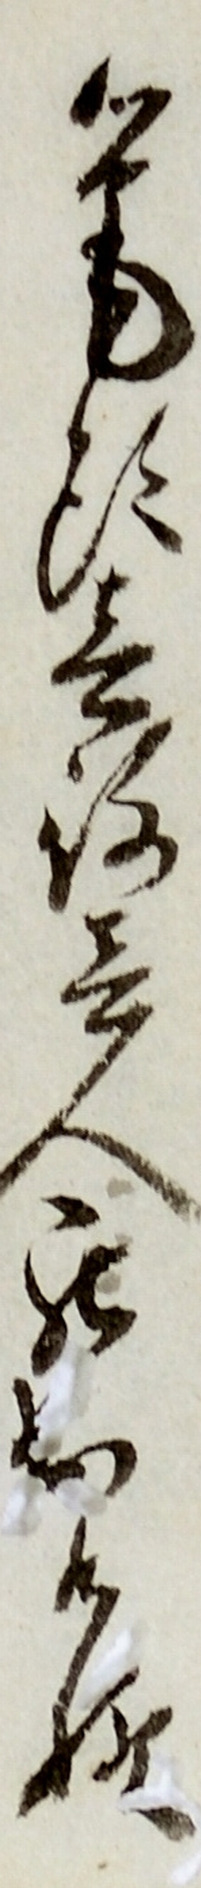御番頭壱役壱人被出候様
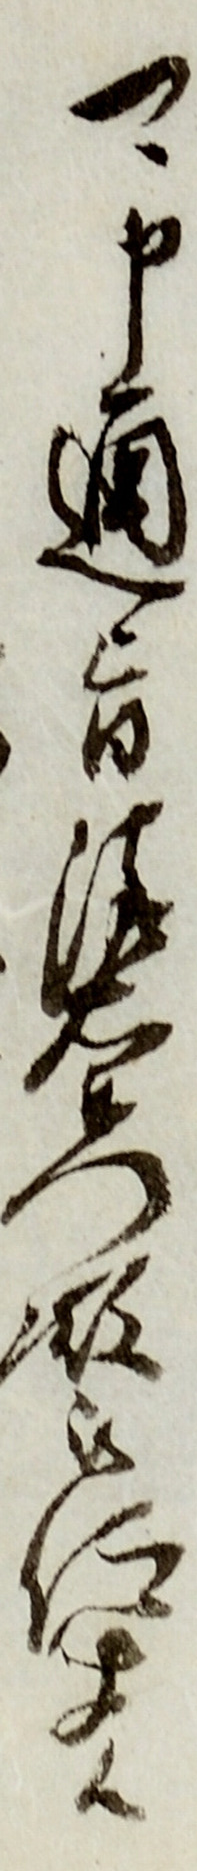可申通旨清右衛門殿被仰聞候
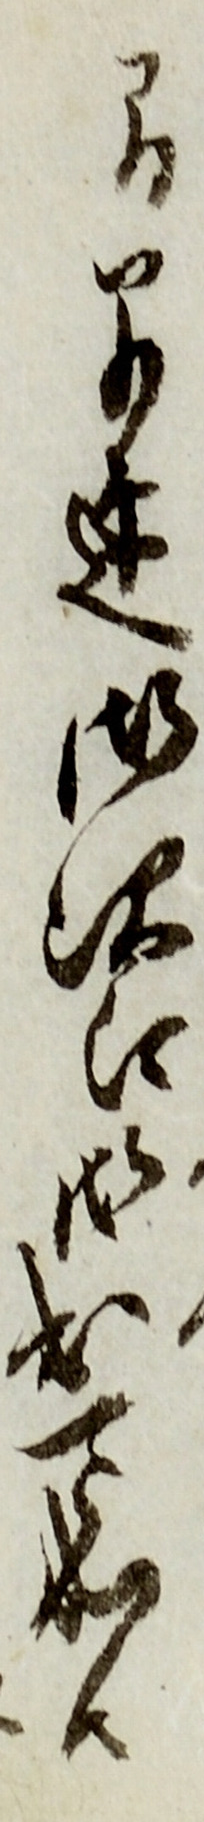間早速御次え御出可被成候以上
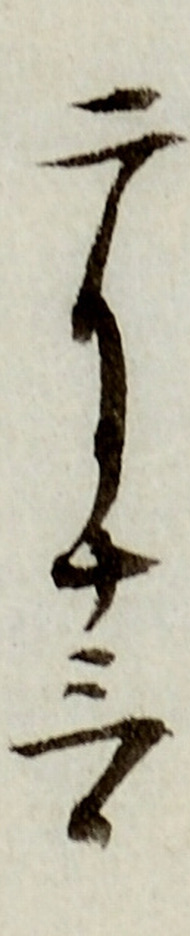二月十三日
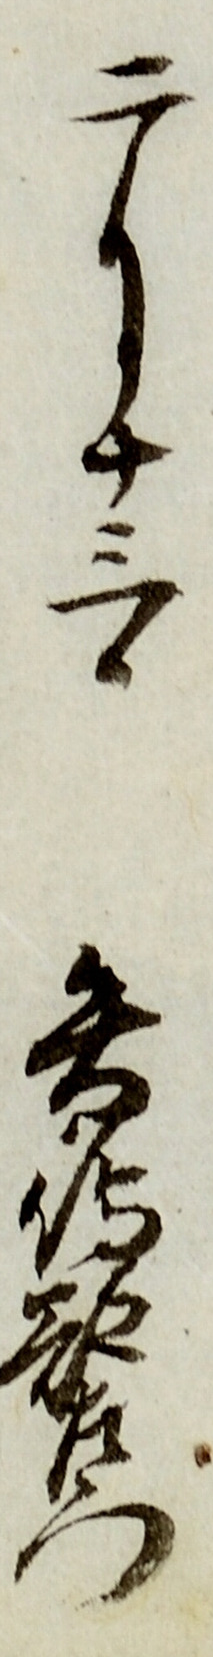二月十三日矢嶋郡左衛門
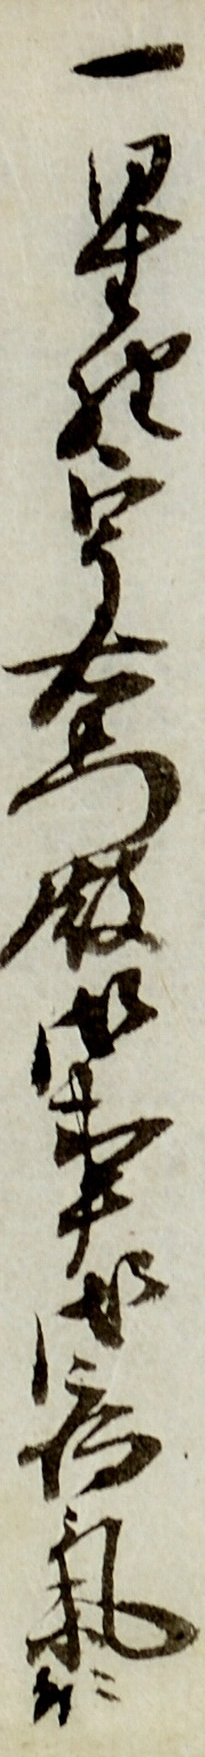一星野宇右衛門殿御事御病気に付
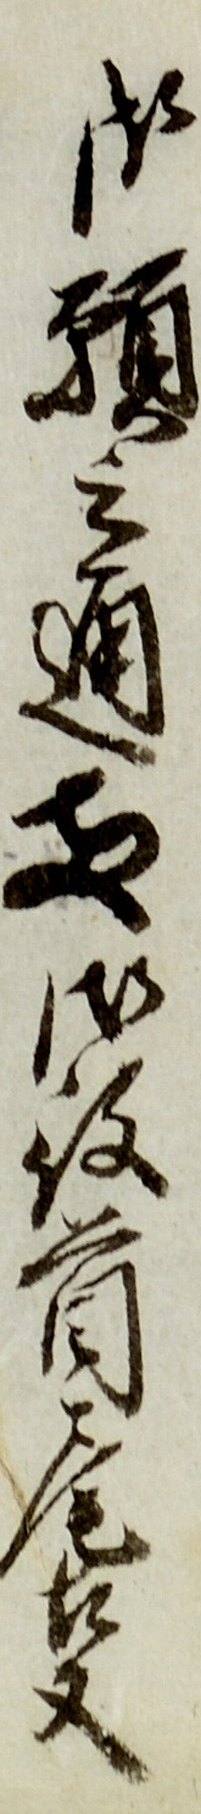御願之通両御役首尾事
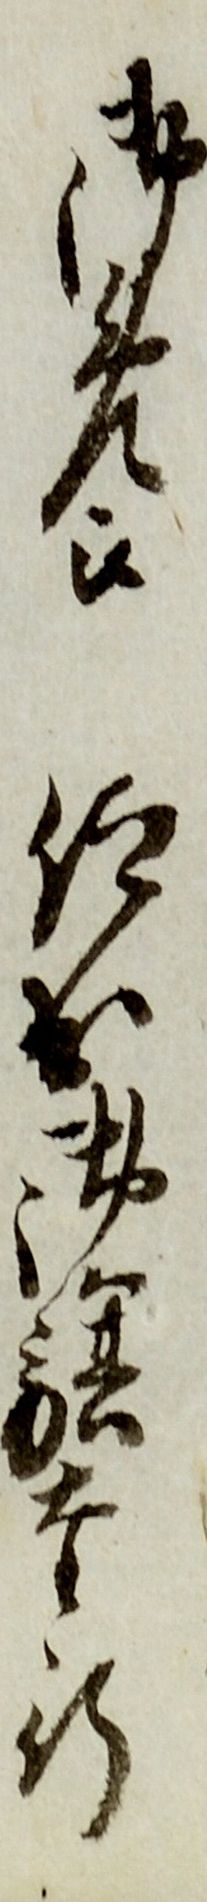御免被仰出御旗奉行
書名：諸事御用留帳
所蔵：伊那市立高遠町図書館・合同会社AMANE
